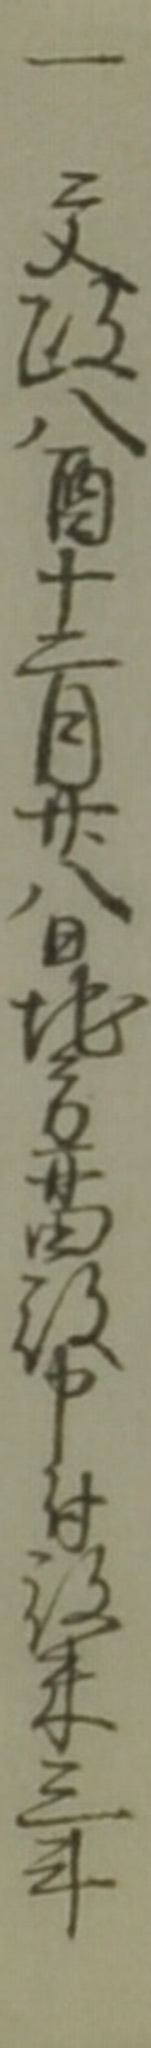一文政八酉十二月廿八日地方◻︎役申付役米三斗
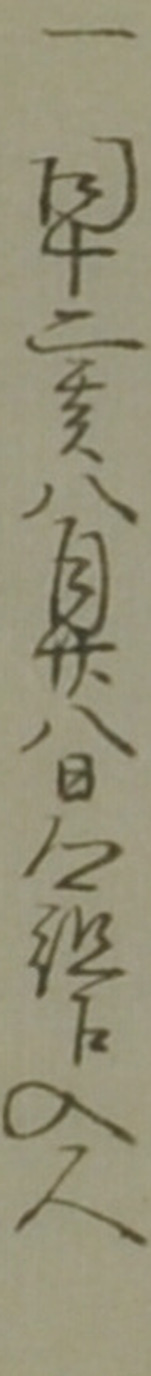一同十二亥八月廿八日郷組江入人
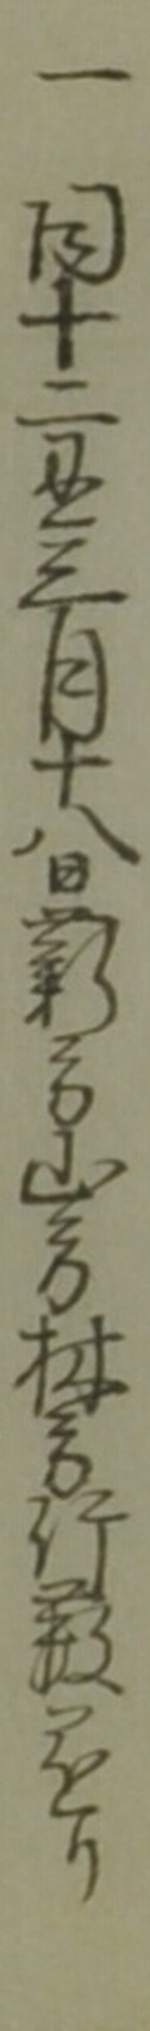一同十二丑三月十八日薪方山方林方竹薮遣り
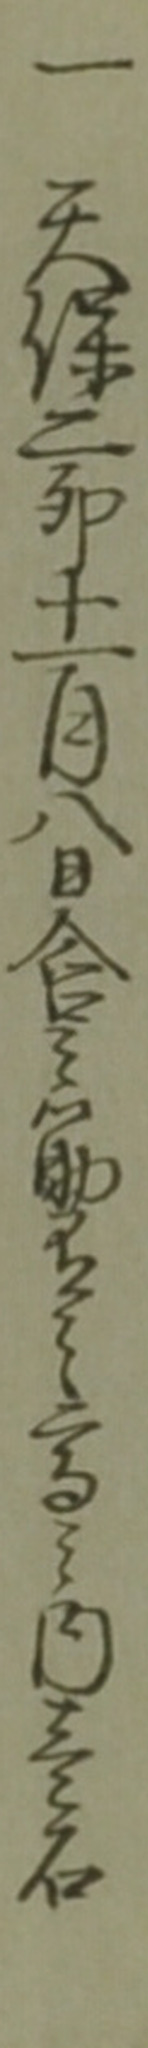一天保二卯十一月八日含之筋之高之内壱石
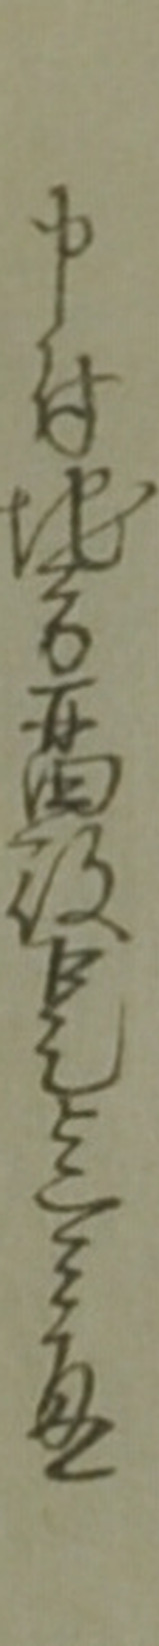申付地方◻︎役是迄之通
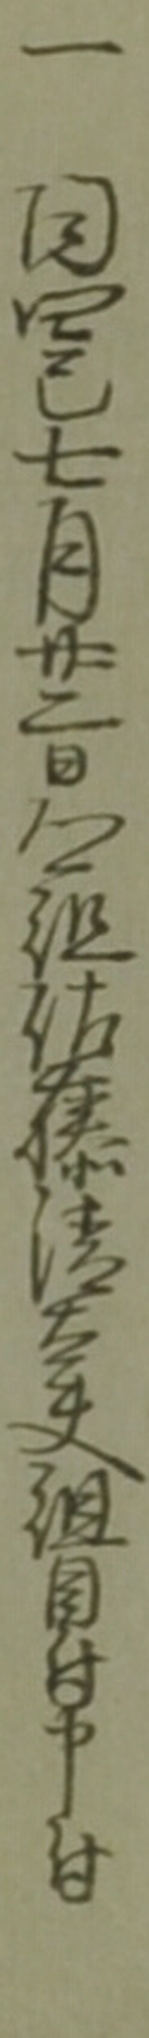一同四巳七月廿二日郷組佐藤清太夫組目付申付
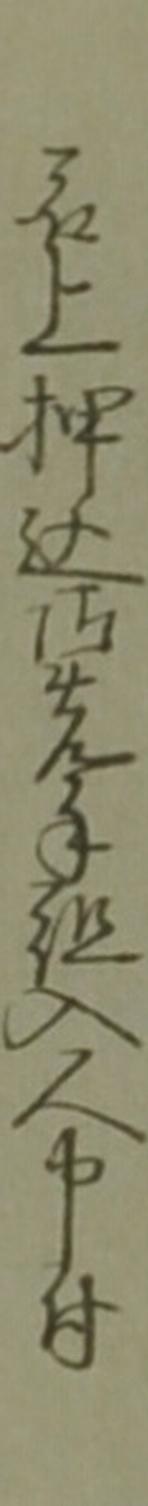召上押込御先手組入人申付
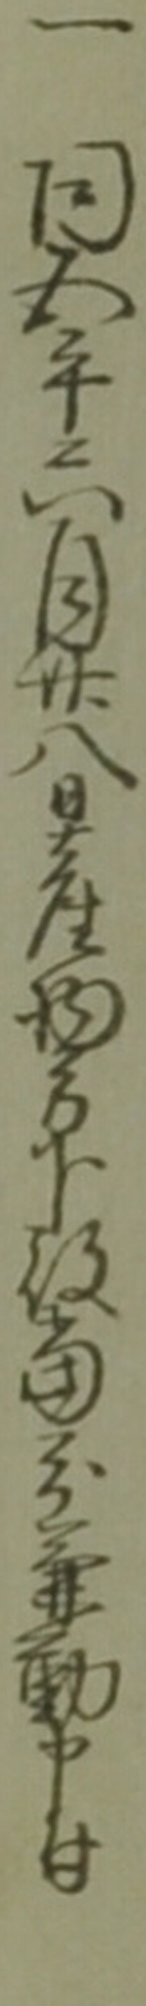一同五午六月廿八日産物方下役当分兼勤申付
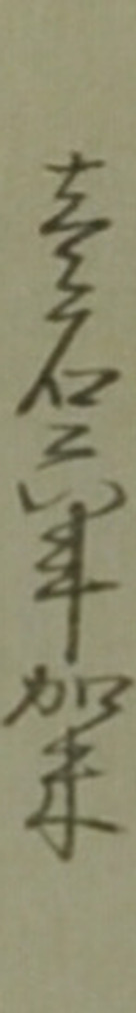壱石六斗加米
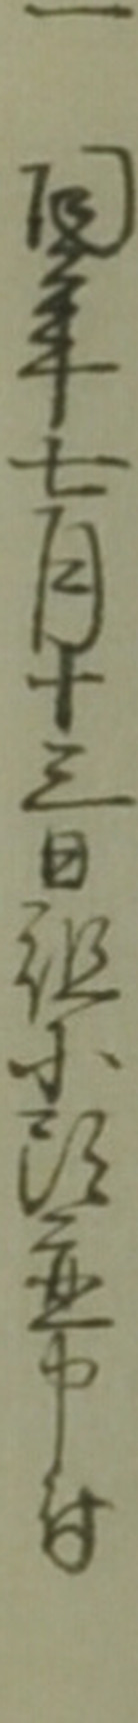一同年七月十三日組小頭並申付
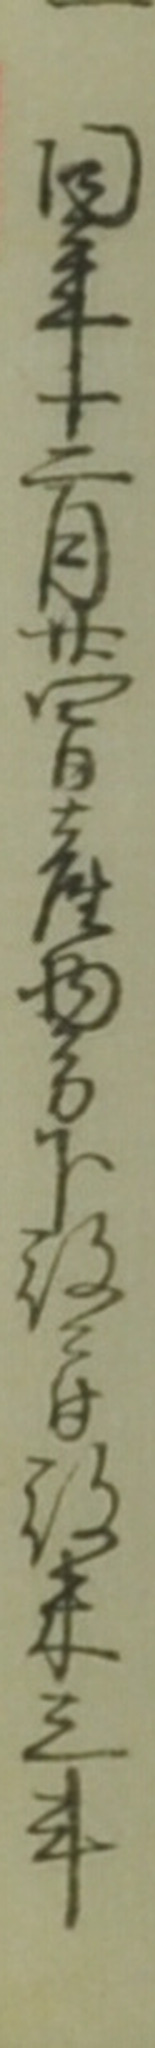一同年十二月廿四日産物方下役ニ付役米三斗

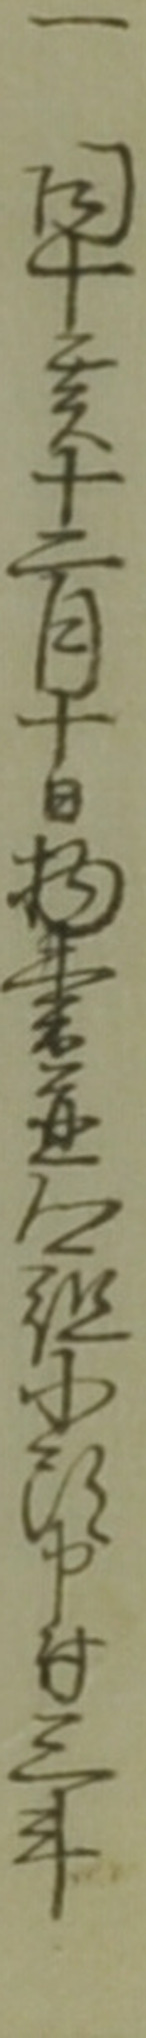一同十亥十二月十日物書並郷組小頭申付三斗
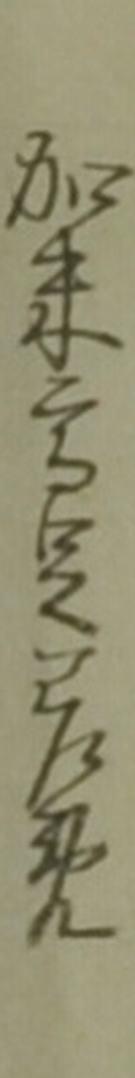方米高足差免
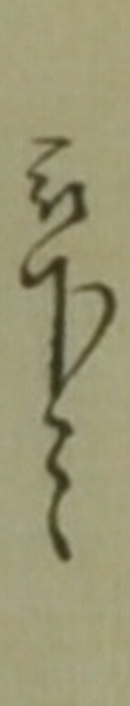被下之
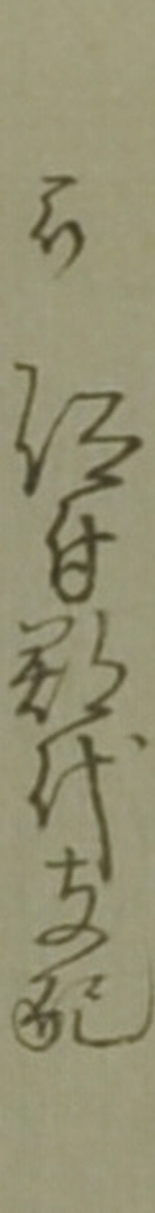被仰付郡代支配
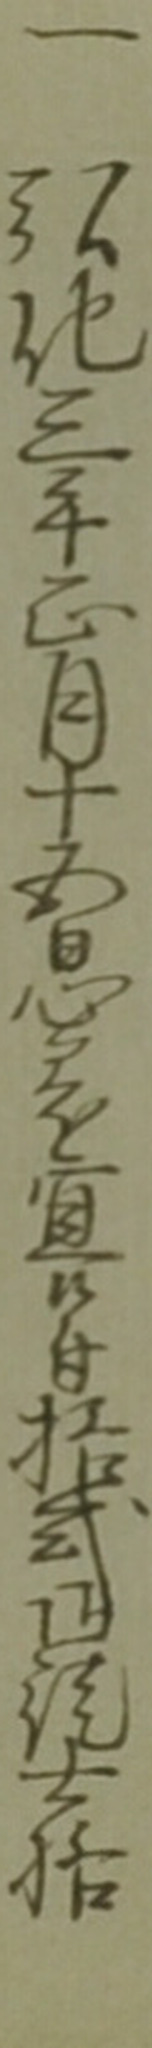一弘化三午正月十五日心懸宜候付格式御徒士格
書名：無足諸士勤仕録（八）
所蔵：伊那市立高遠町図書館・合同会社AMANE
